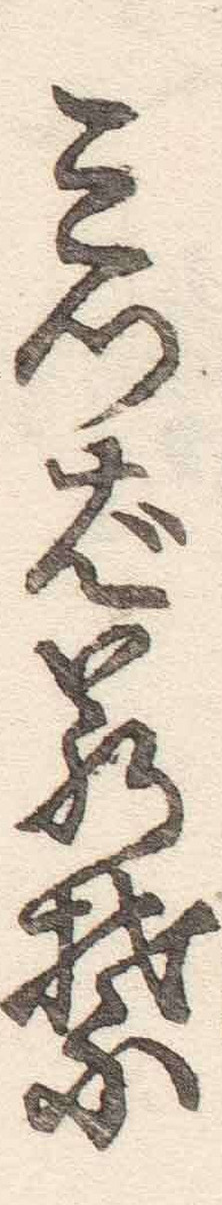みつば若葉
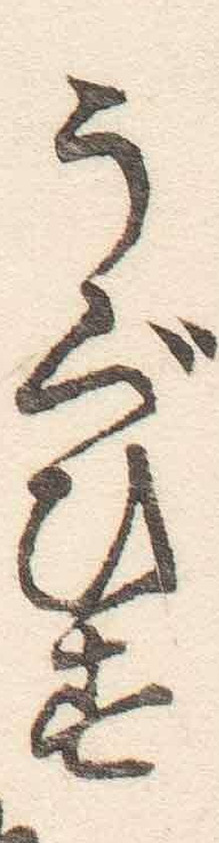うぐひす
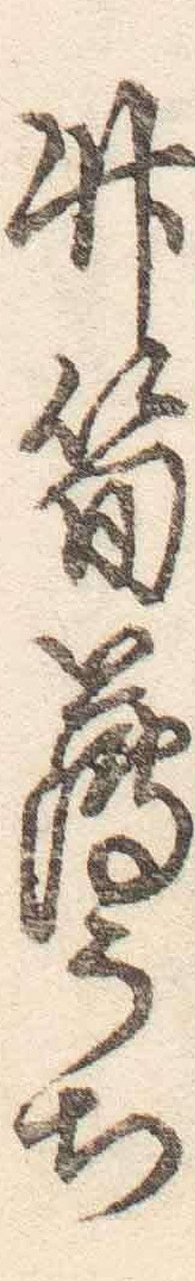竹筍薄うち
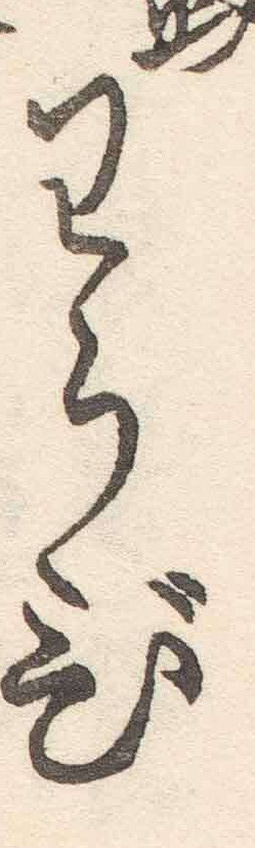わらび
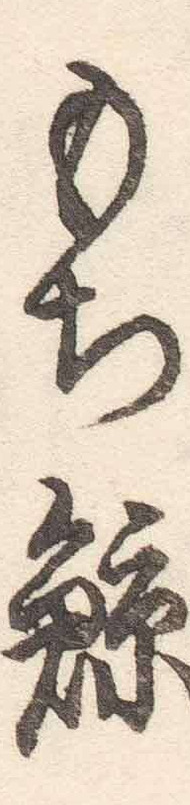もち鯨
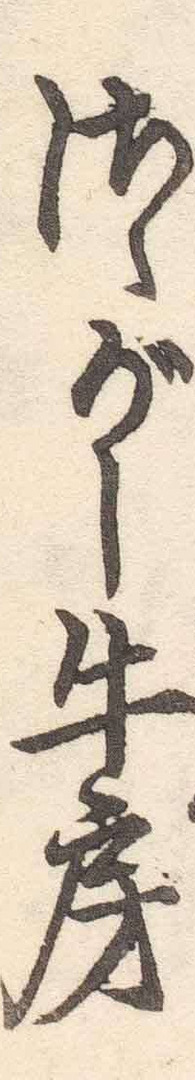さゝがし牛蒡
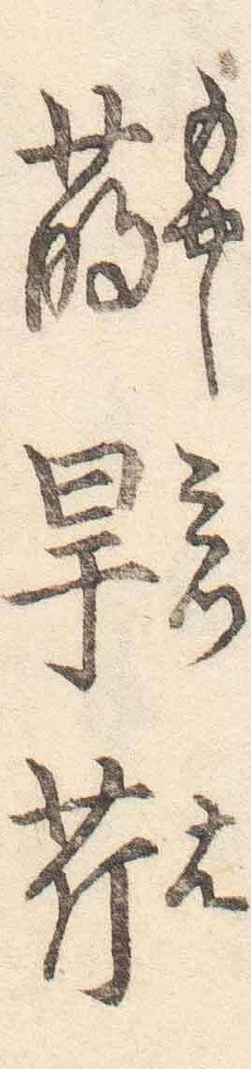萌旱芹
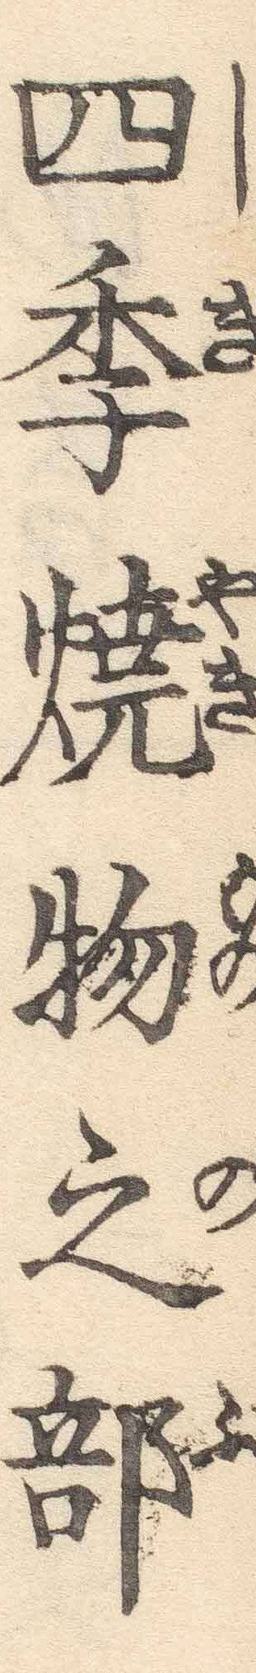四季焼物之部
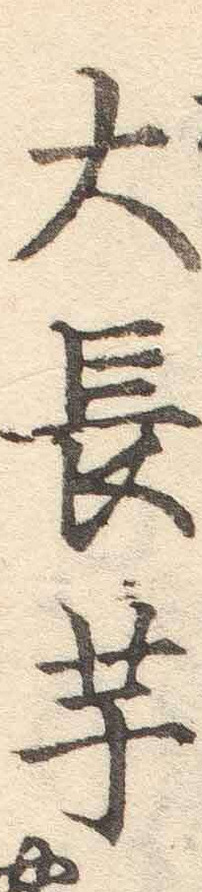大長芋
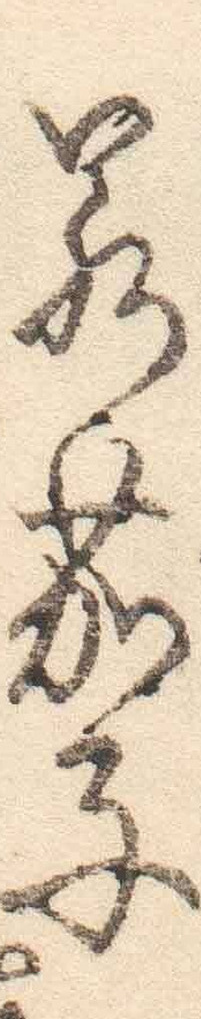若茄子
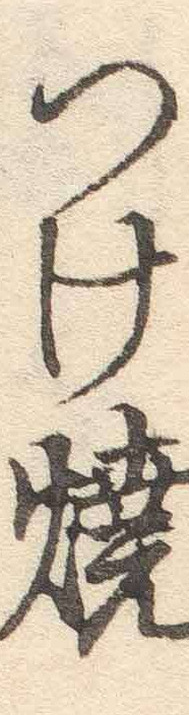つけ焼
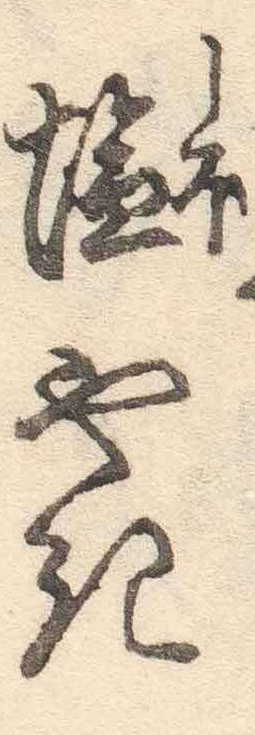塩やき
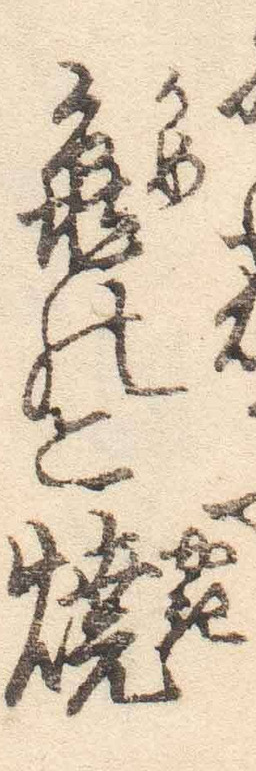亀のこ焼
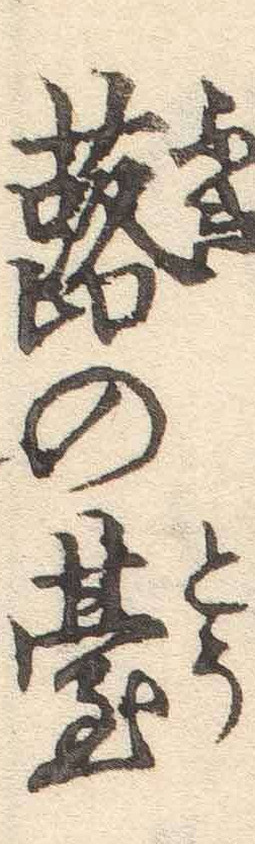蕗の薹
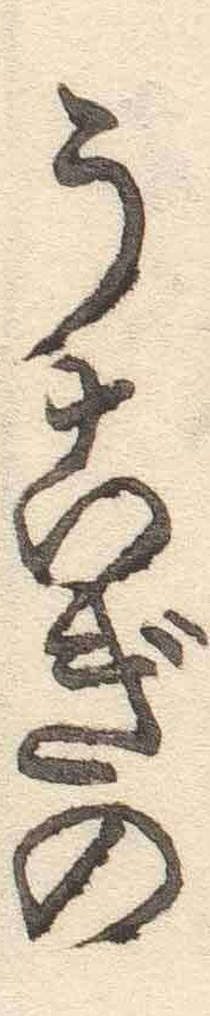うこぎの
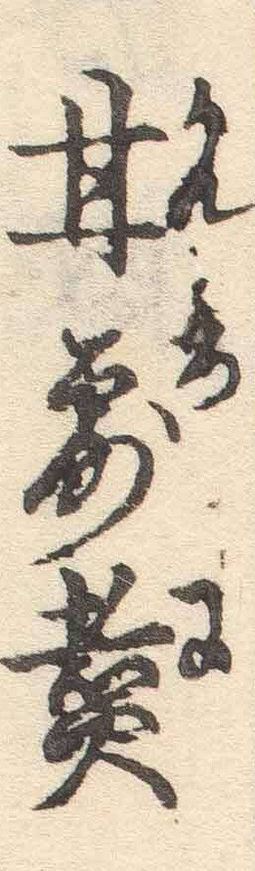甘露煮
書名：料理通
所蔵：東京学芸大学附属図書館 国文学研究資料館
